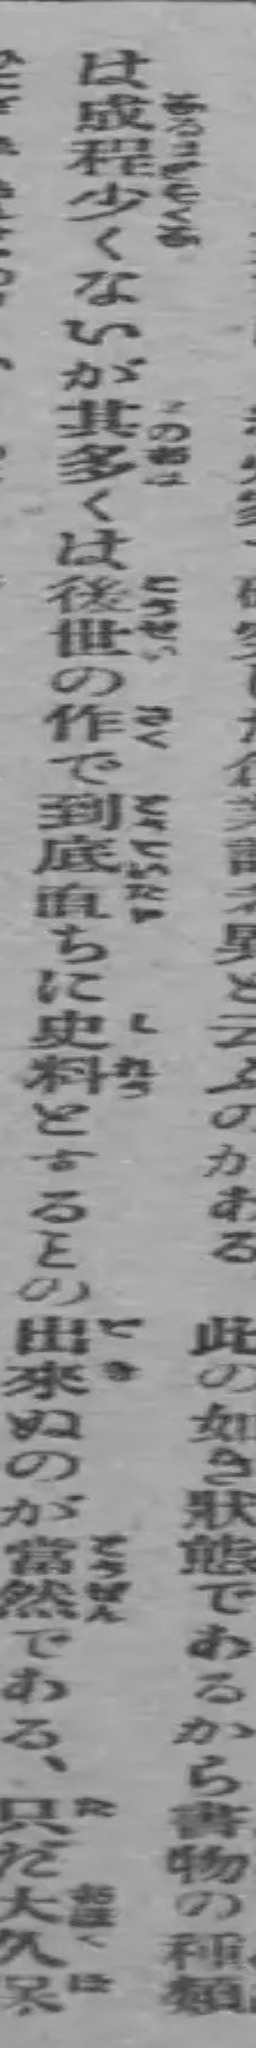は成程少くないが其多くは後世の作で到底直ちに史料とすることの出来ぬのが当然である、只だ大久保
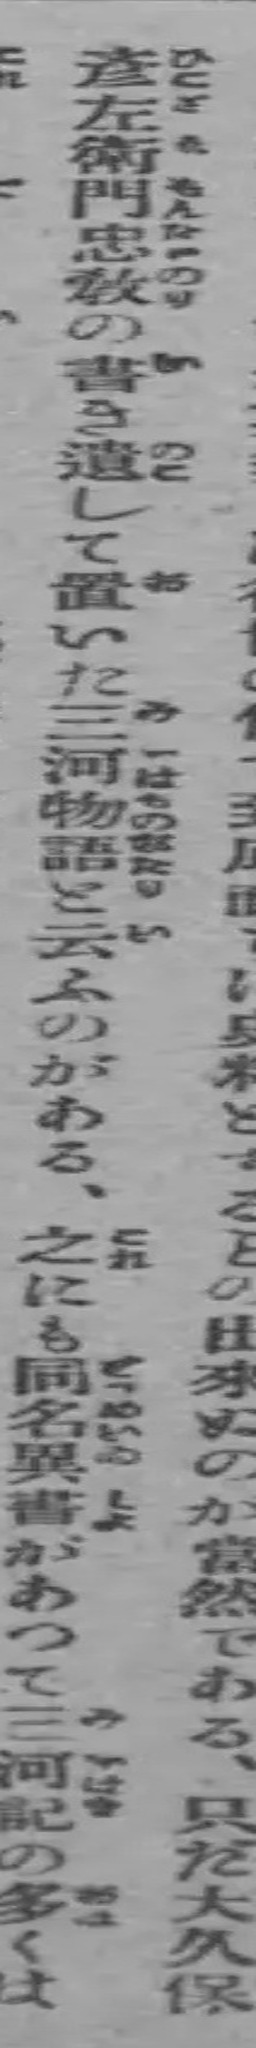三河物語彦左衛門忠教の書き遺して置いた三河物語と云ふのがある、之にも同名異書があつて三河記の多くは
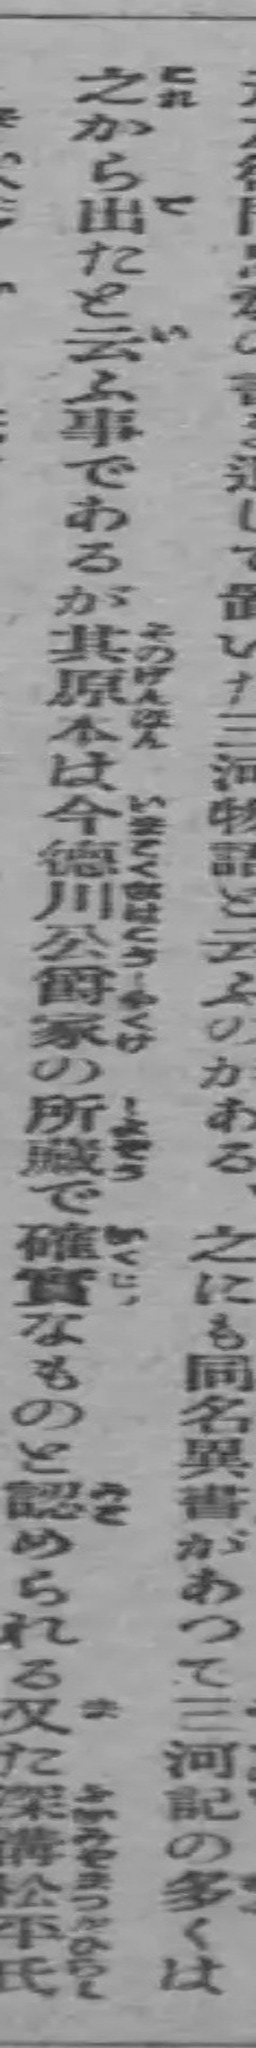之から出たと云ふ事であるが其原本は今徳川公爵家の所蔵で確実なものと認められる又た深溝松平氏
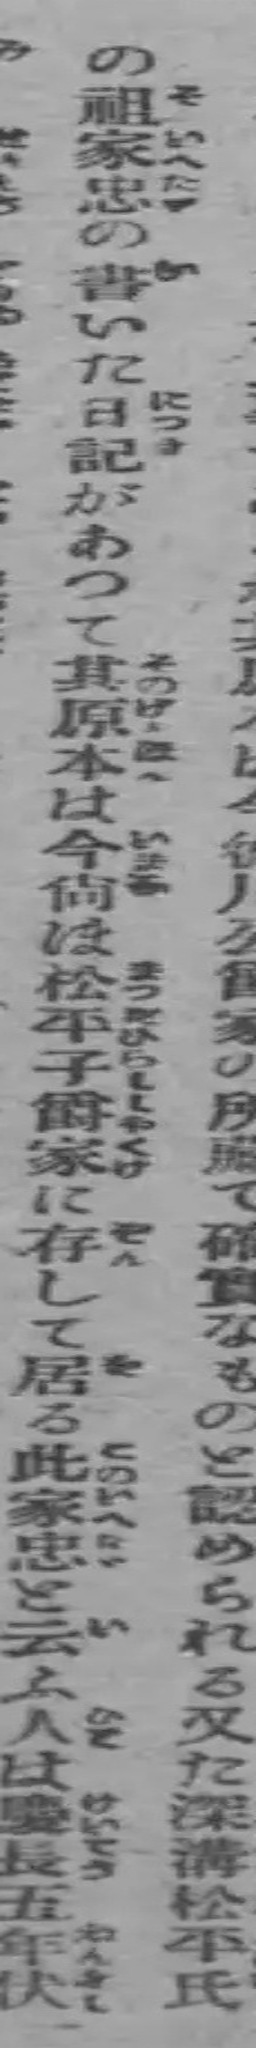家忠日記の祖家忠の書いた日記があつて其原本は今尚ほ松平子爵家に存して居る此家忠と云ふ人は慶長五年伏
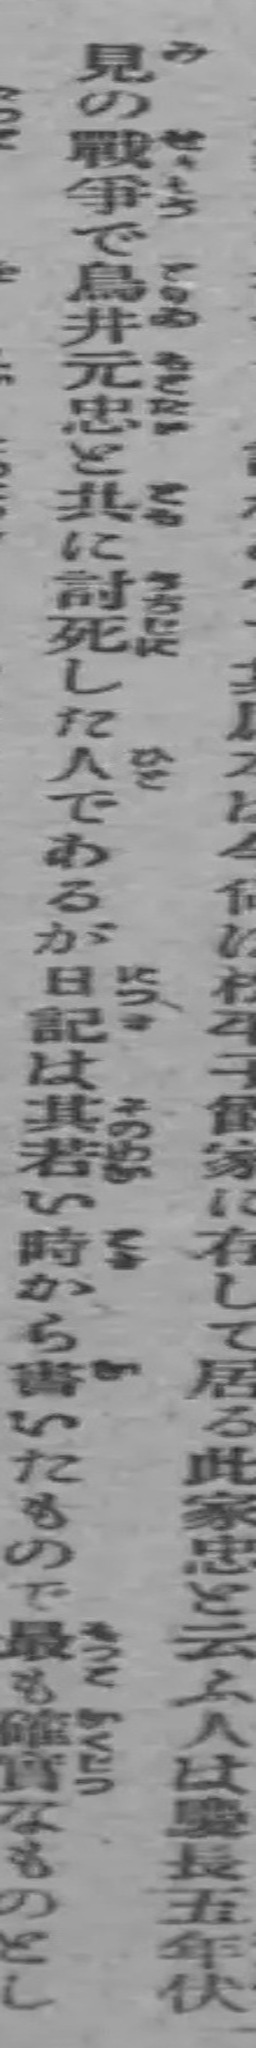見の戦争で鳥井元忠と共に討死した人であるが日記は其若い時から書いたもので最も確実なものとし
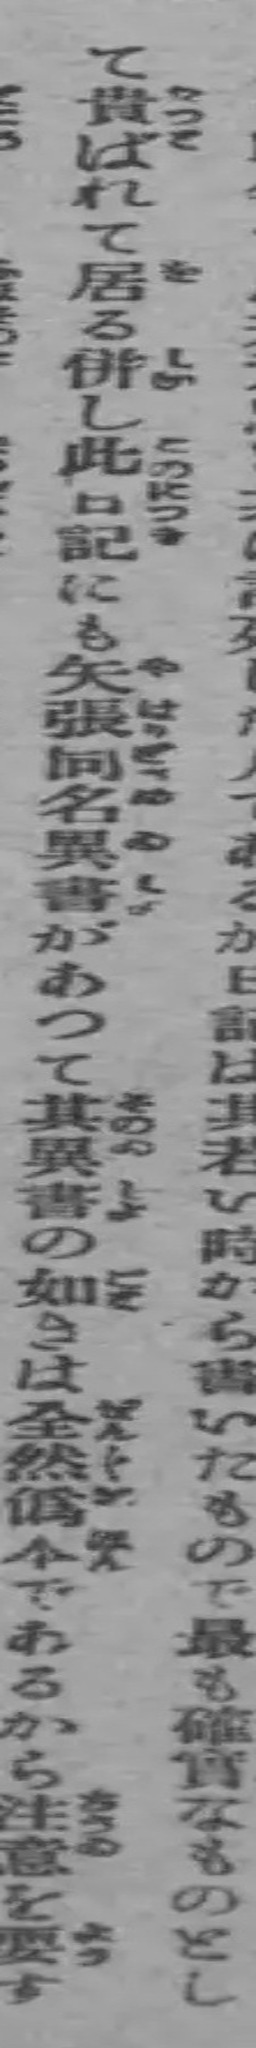て貴ばれて居る併し此日記にも矢張同名異書があつて其異書の如きは全然偽本であるから注意を要す
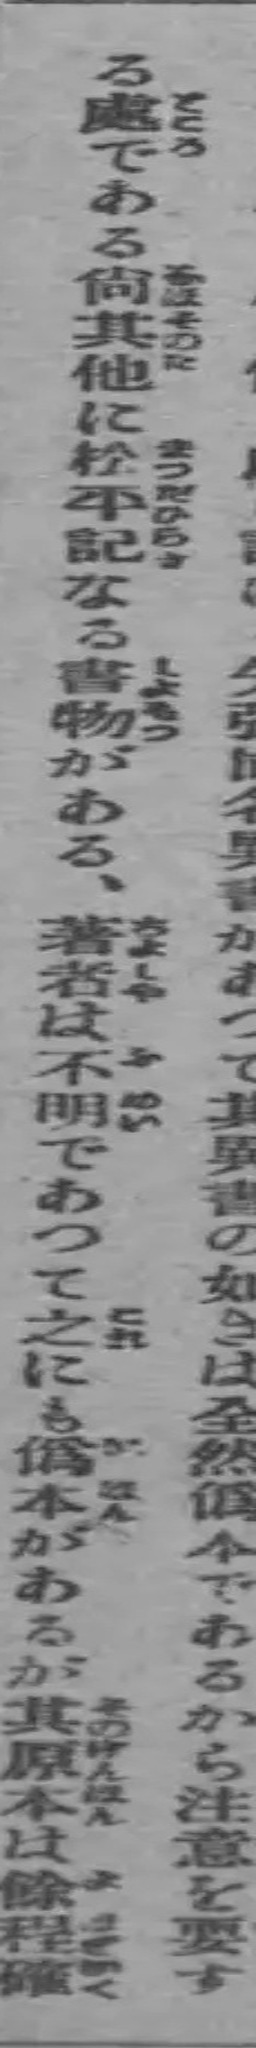松平記る処である尚其他に松平記なる書物がある、著者は不明であつて之にも偽本があるが其原本は余程確
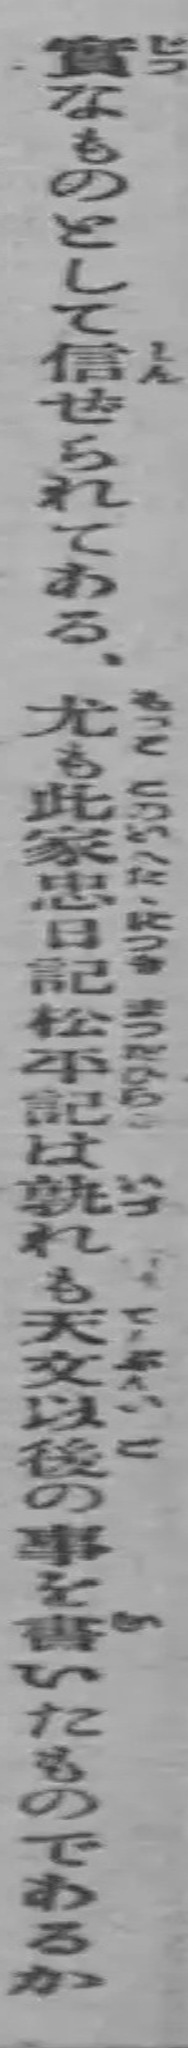実なものとして信ぜられてある、尤も此家忠日記松平記は孰れも天文以後の事を書いたものであるか
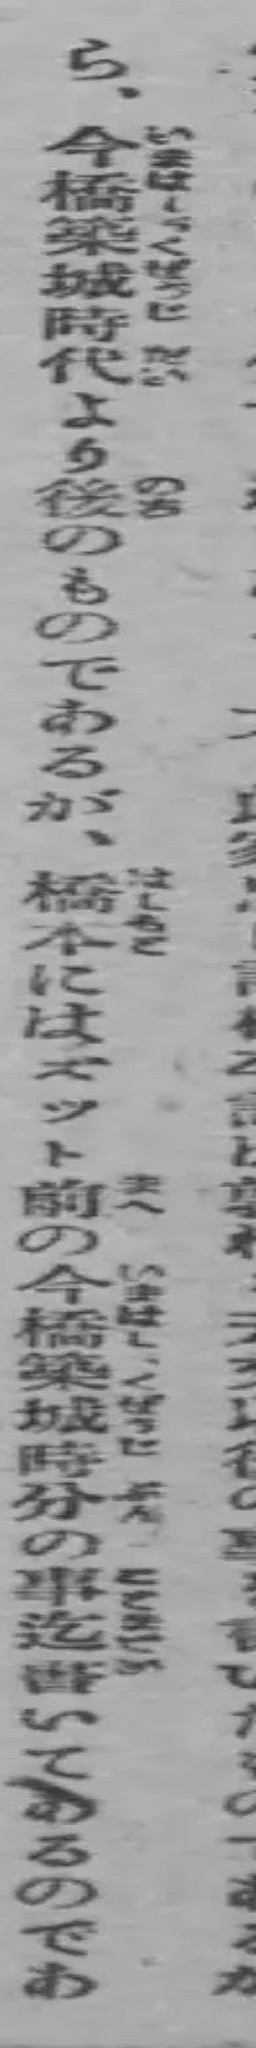ら、今橋築城時代より後のものであるが、橋本にはズツト前の今橋築城時分の事迄書いてあるのであ
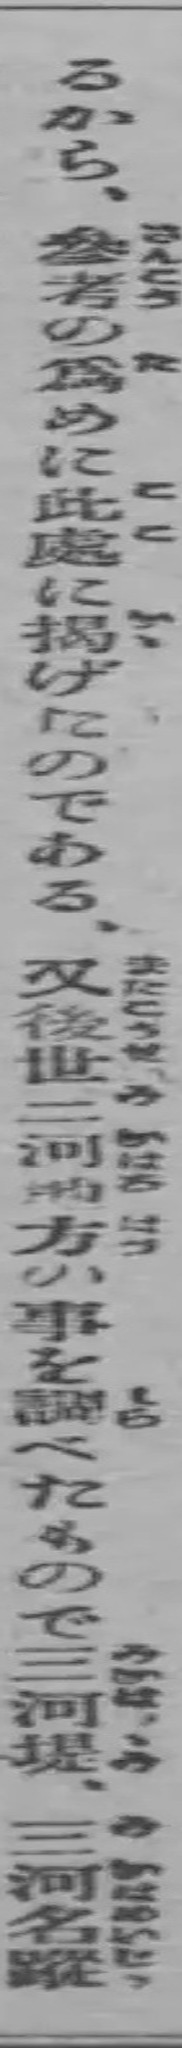るから、参考の為めに此処に掲げたのである、又後世三河地方の事を調べたもので三河堤、三河名蹤
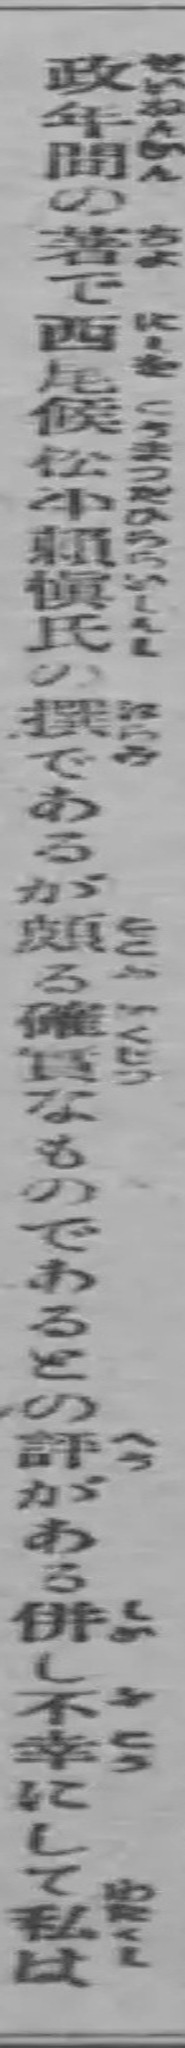政年間の著で西尾候松平頼慎氏の撰であるが頗る確実なものであるとの評がある併し不幸にして私は
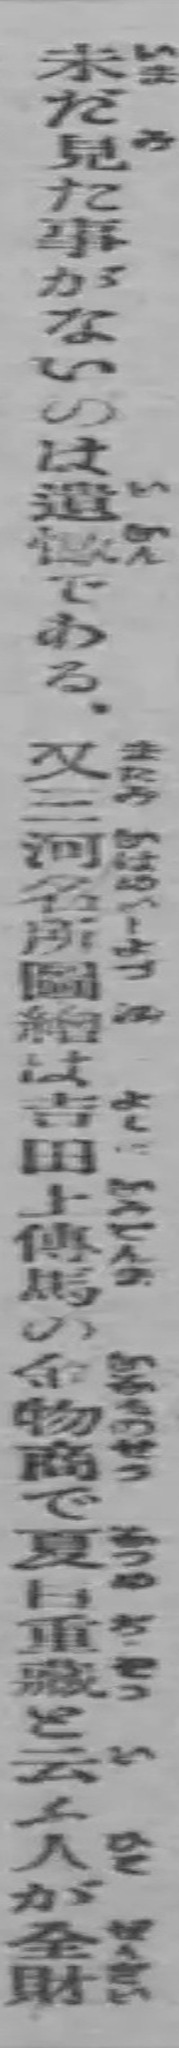未だ見た事がないのは遺憾である、又三河名所図会は吉田上伝馬の金物商で夏目重蔵と云ふ人が全財
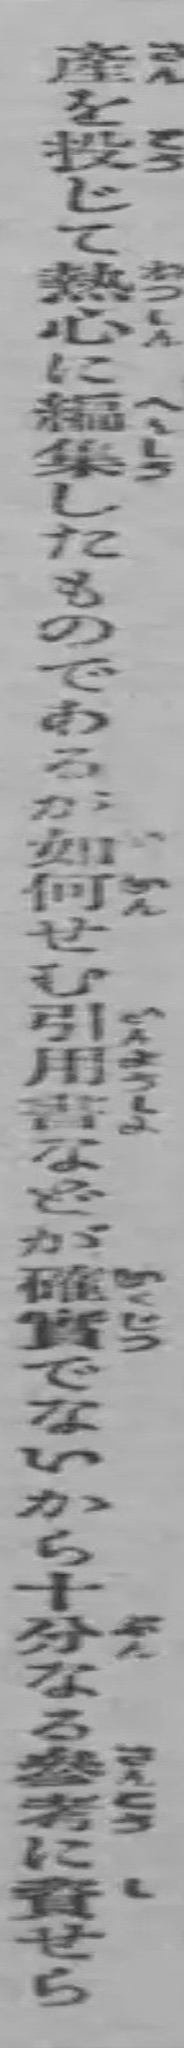牛窪密談記産を投じて熱心に編集したものであるが如何せむ引用書などが確実でないから十分なる参考に資せら
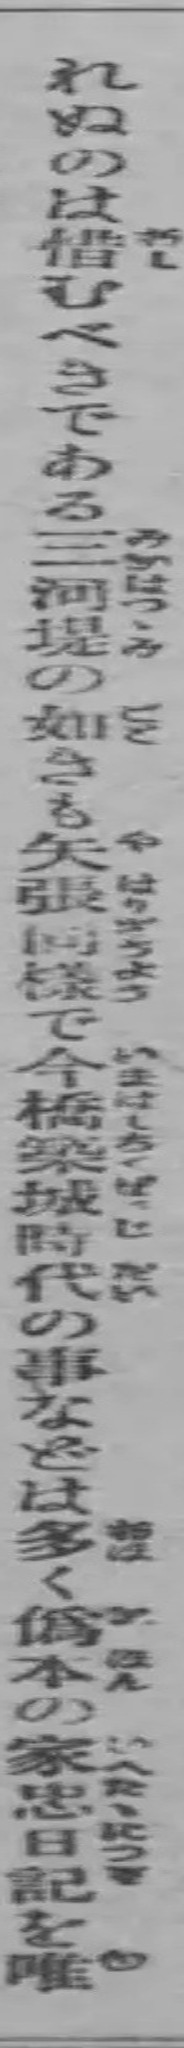れぬのは惜むべきである三河堤の如きも矢張同様で今橋築城時代の事などは多く偽本の家忠日記を唯
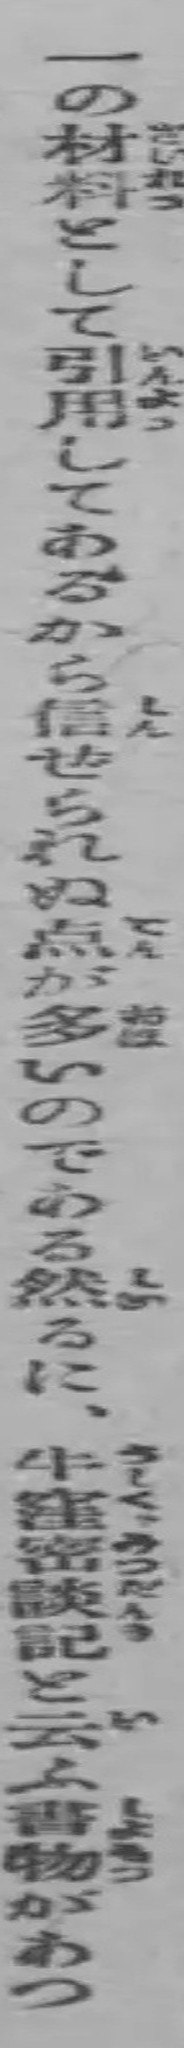一の材料として引用してあるから信ぜられぬ点が多いのである然るに、牛窪密談記と云ふ書物があつ
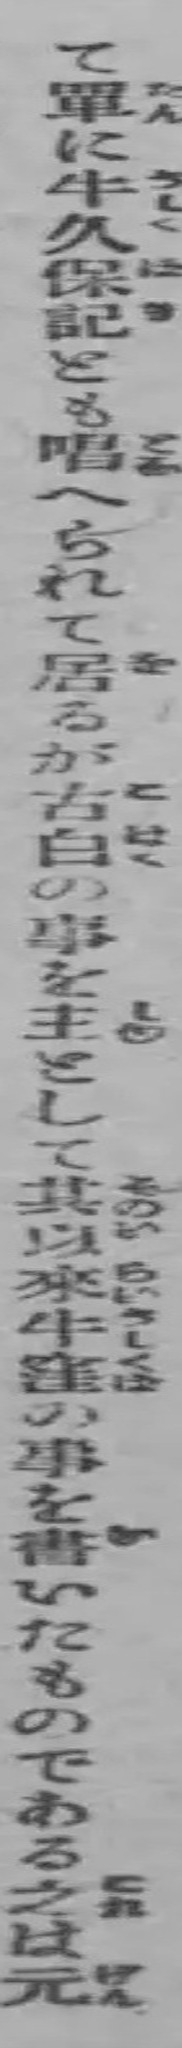て単に牛久保記とも唱へられて居るが古白の事を主として其以来牛窪の事を書いたものである之は元
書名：豊橋市史談
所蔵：国立国会図書館 National Diet Library, JAPAN
